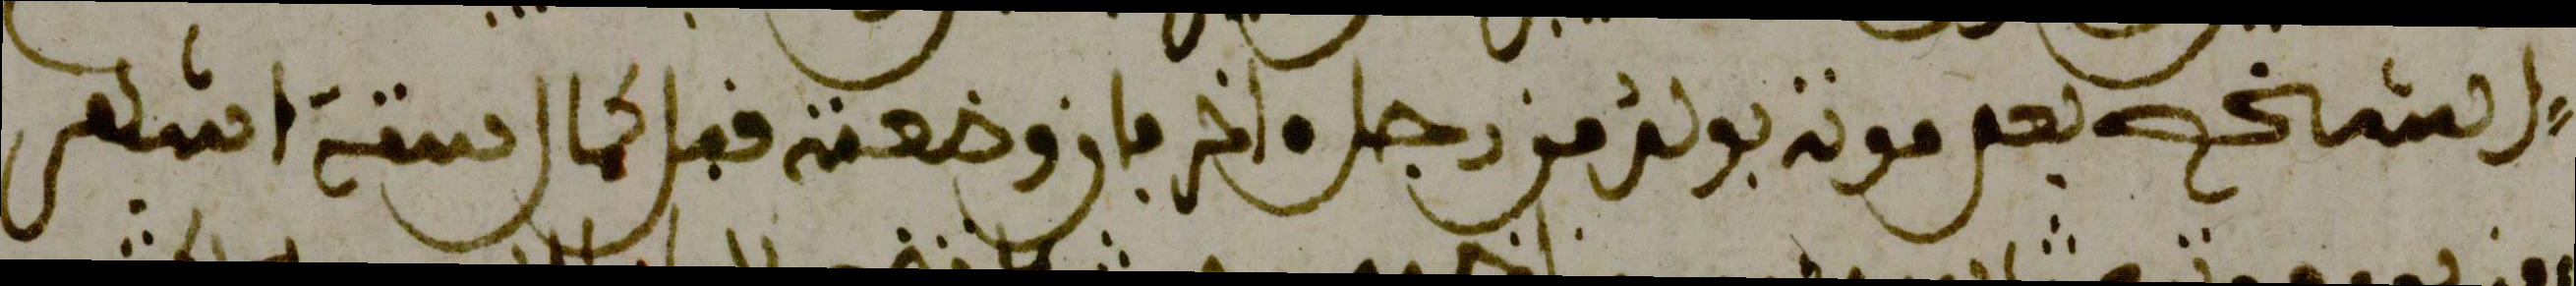الشخص بعد موته بولد من رجل ءاخر فان ووضعته قبل كمال ستة اشهر
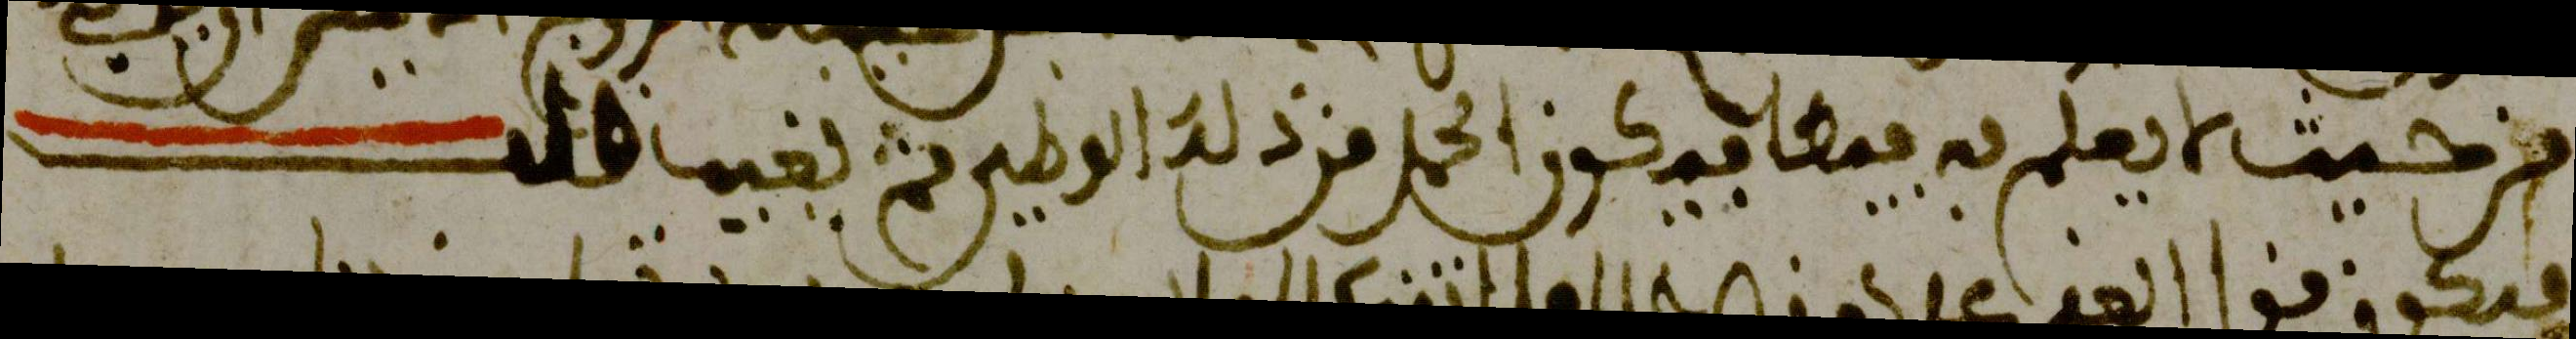من حيث لا يعلم به فيطا فيكون الحمل من ذلك الوطي ثم يغيب قلت
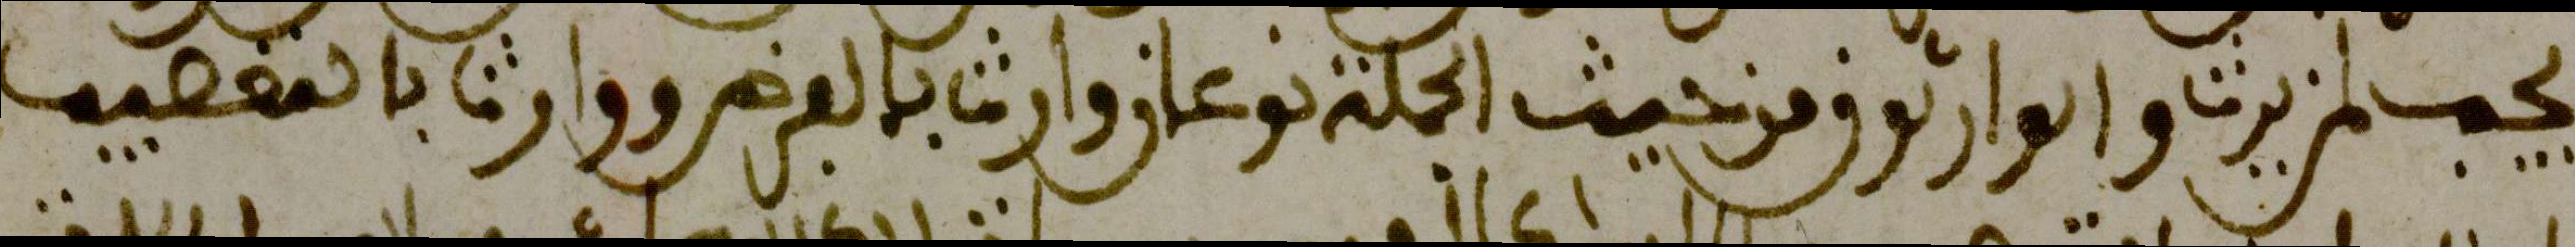يجب لمن يرث والوارثون من حيث الحملة نوعان وارث بالفرض ووارث بالتعصيب
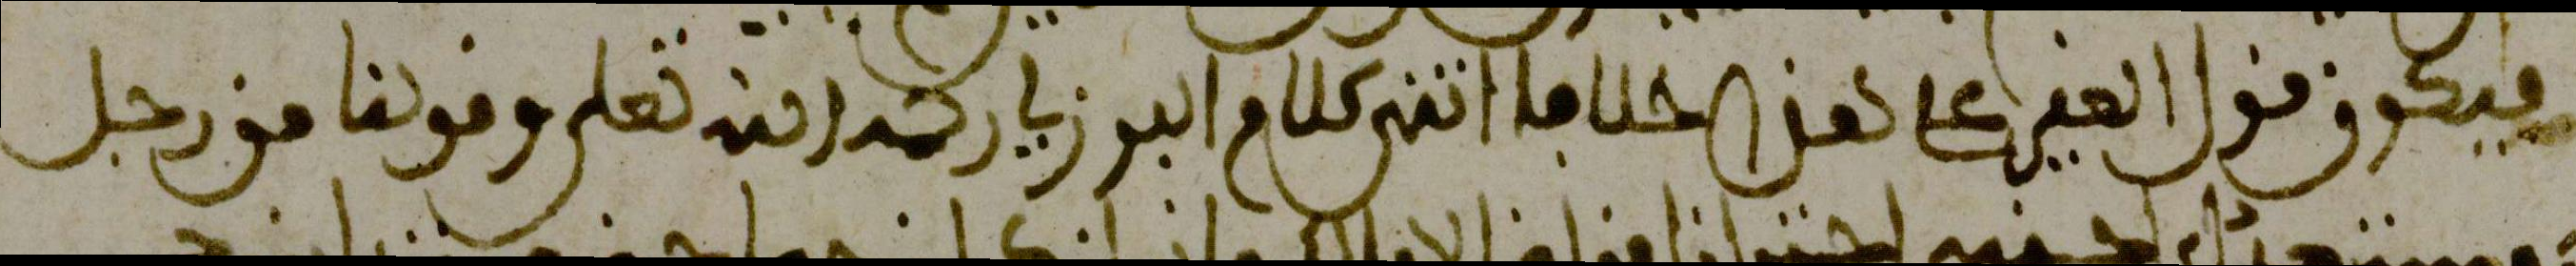فيكون قول الغير على هذا خلافا انتهى كلام البرزلي رحمه الله تعلى وقولنا من رجل
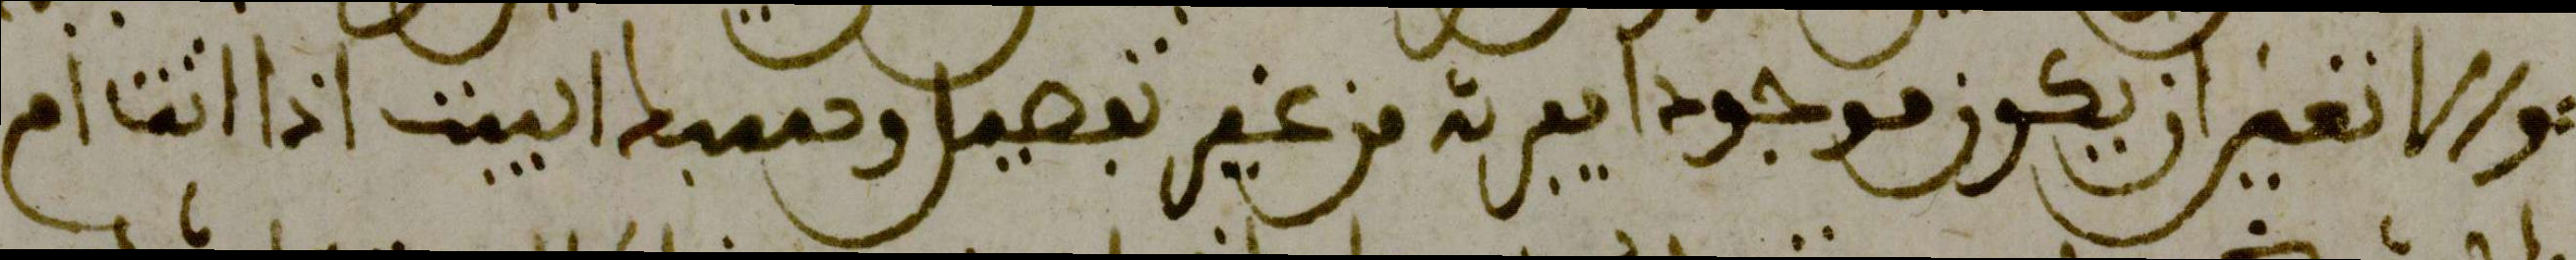والاتعين ان يكون موجود افيرثه من غير تفصيل وسبك البيت اذا اتت ام
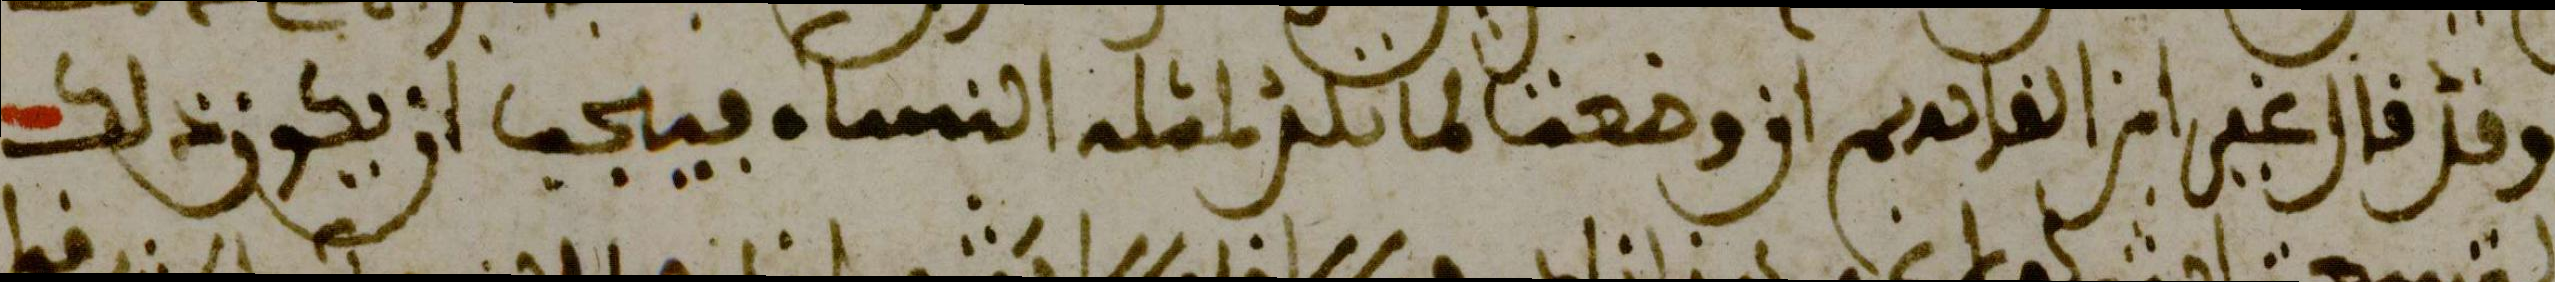وقد قال غير ابن القاسم ان وضعت لما تلد لمثله النساء فيجب ان يكون ذلك
